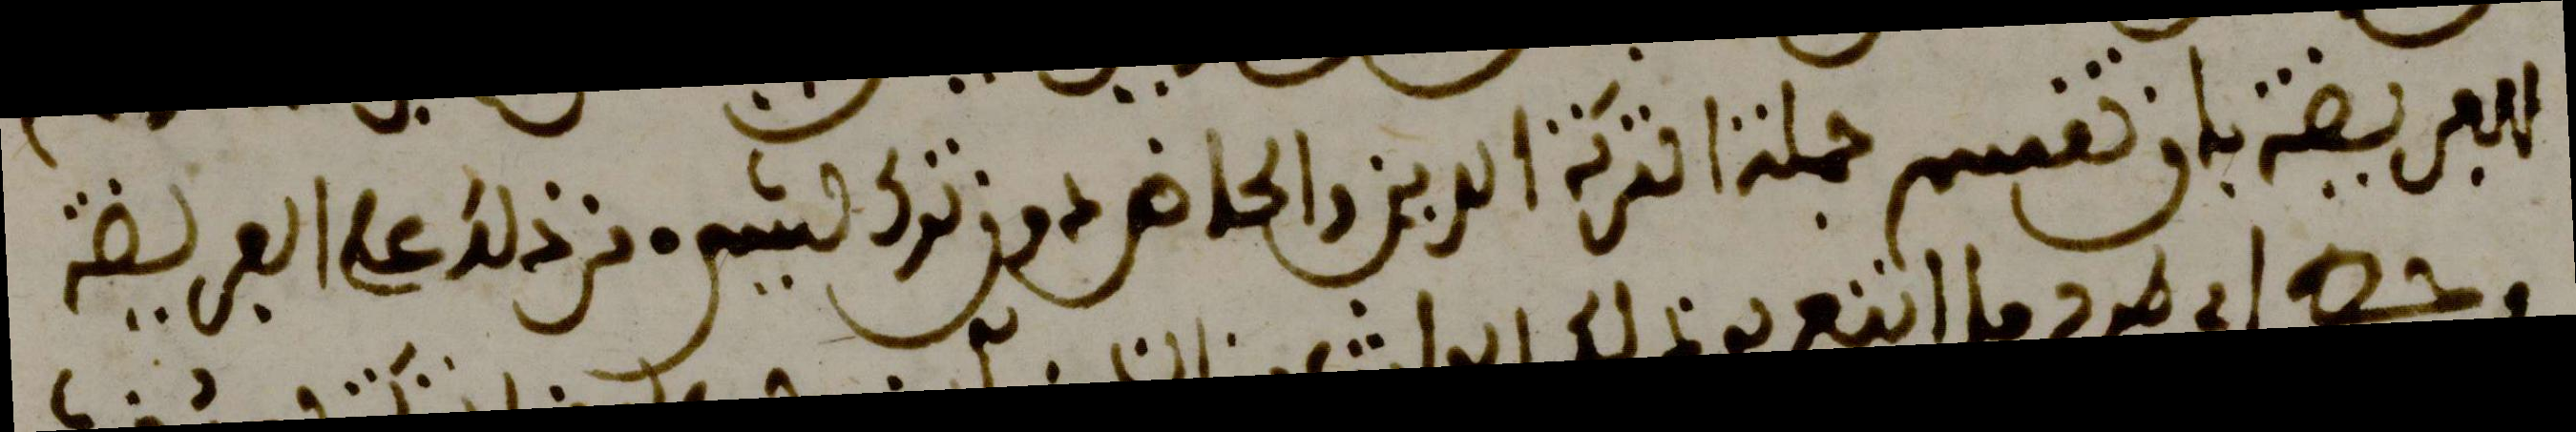للفريضة بان تقسم جملة التركة الدين والحاضر دون ترك لشيء من ذلك على الفريضة
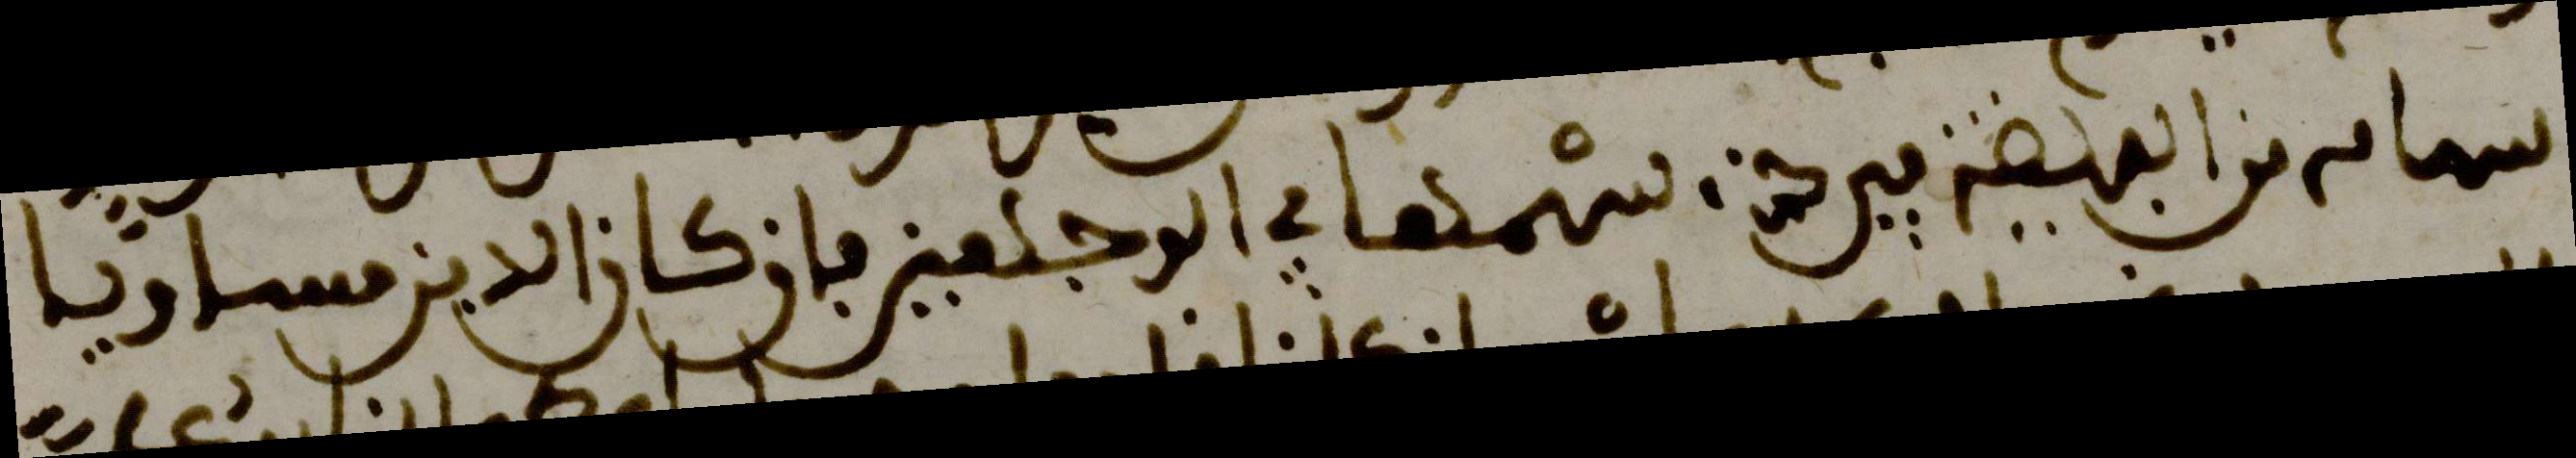سهامه من الفريضة في جزء سهْمها في الوجهين فان كان الدين مساويًا
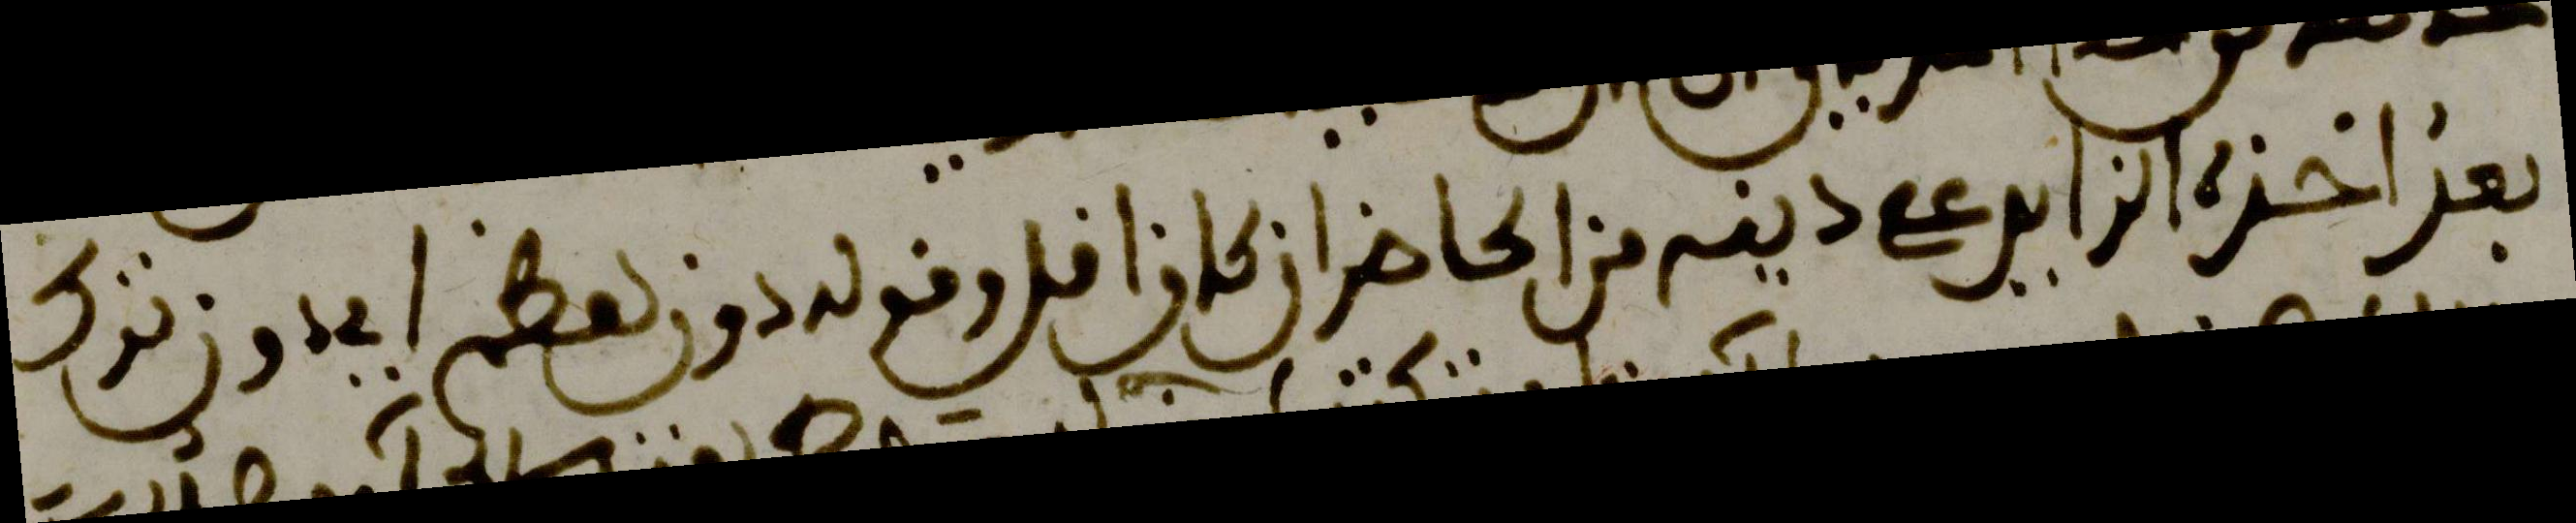بعد اخذه الزايد على دينه من الحاضر ان كان اقل وقوله دون هظم اي دون ترك
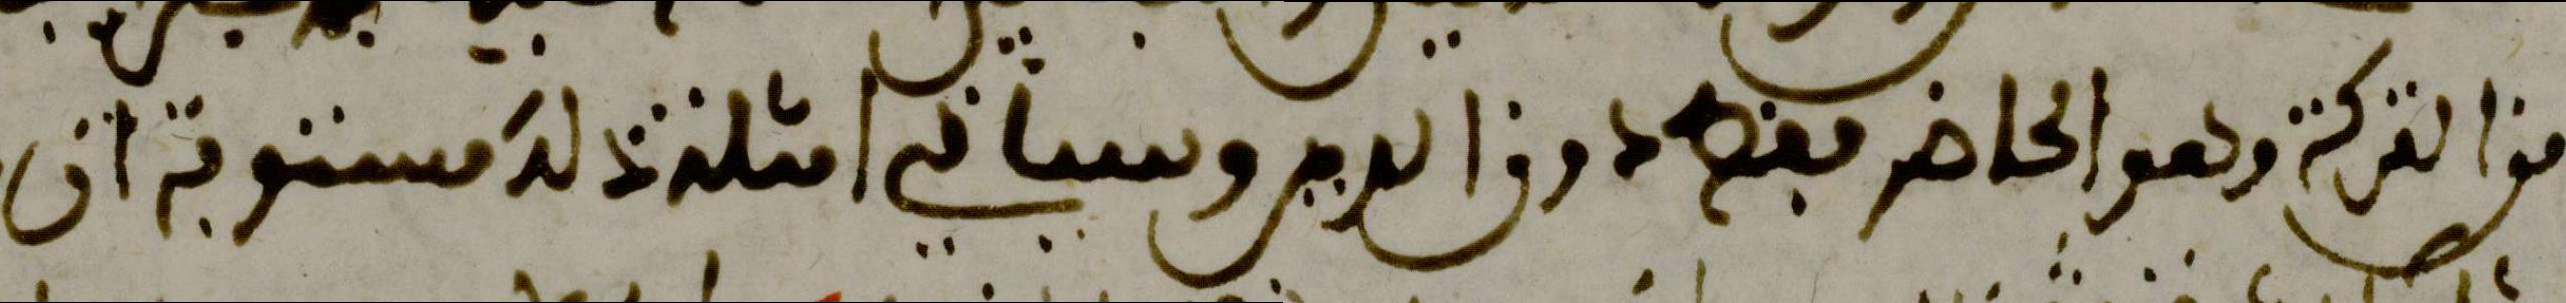من التركة وهو الحاضر فقط دون الدين وستاتي امثلة ذلك مستوفة ان
